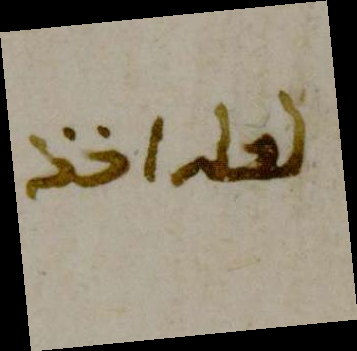لعله اخذ
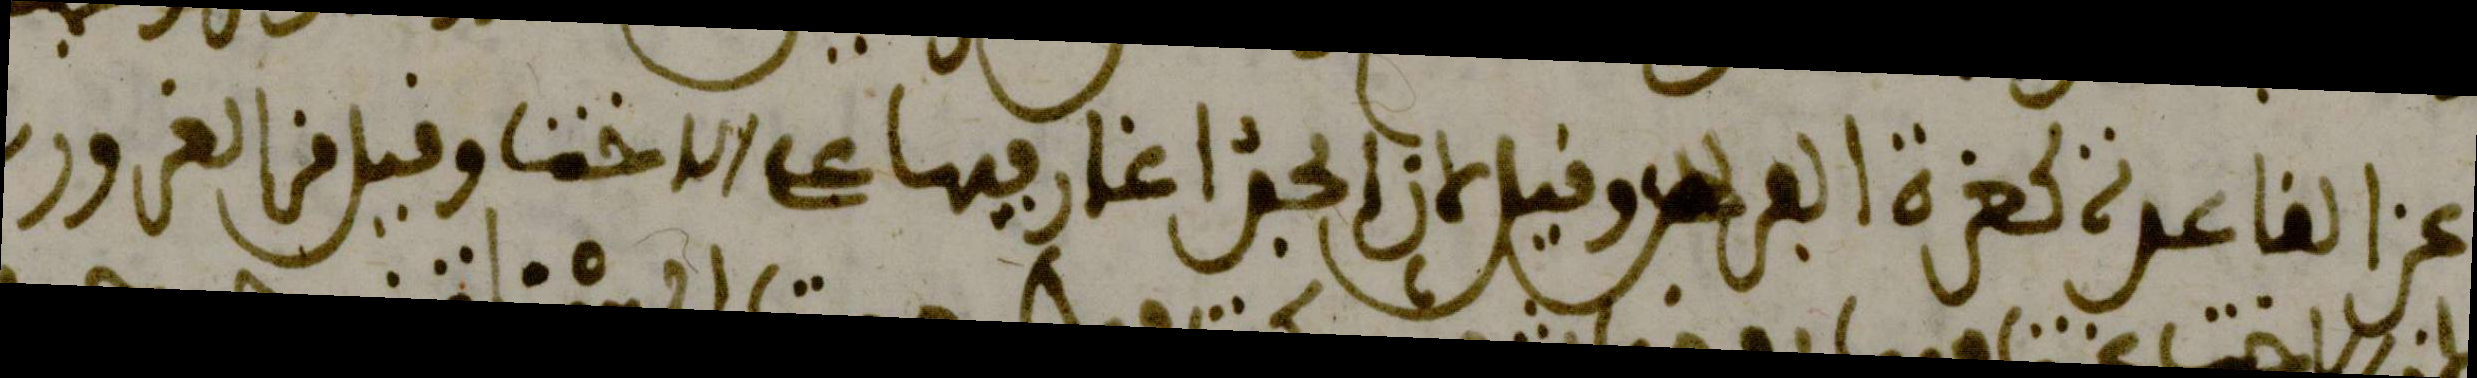عن القاعدة كغرة الفرس وقيل لان الجد اغار فيها على الاخت وقيل من الغرور
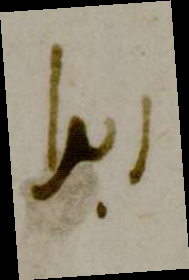ابدا
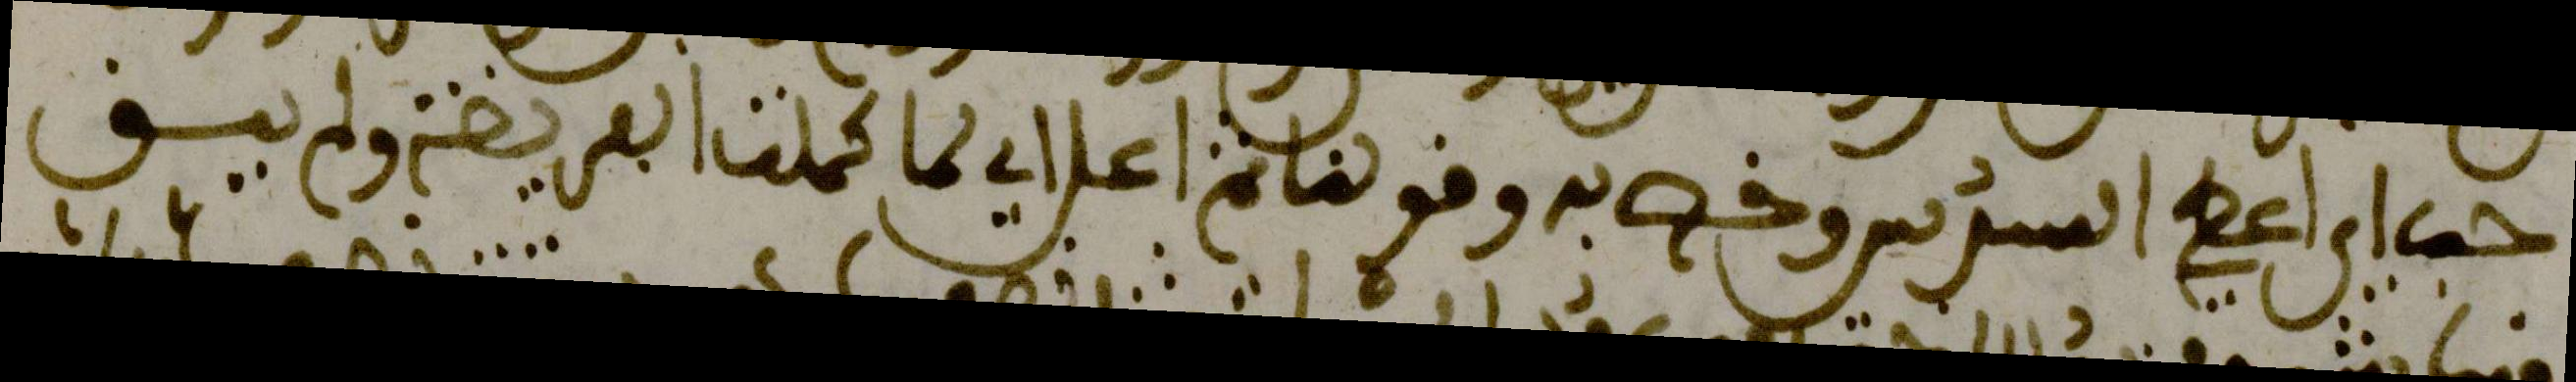حب اي اعطي السدس وخص به وقولنا ثم اعل اي لما كملت الفريضة ولم يبق
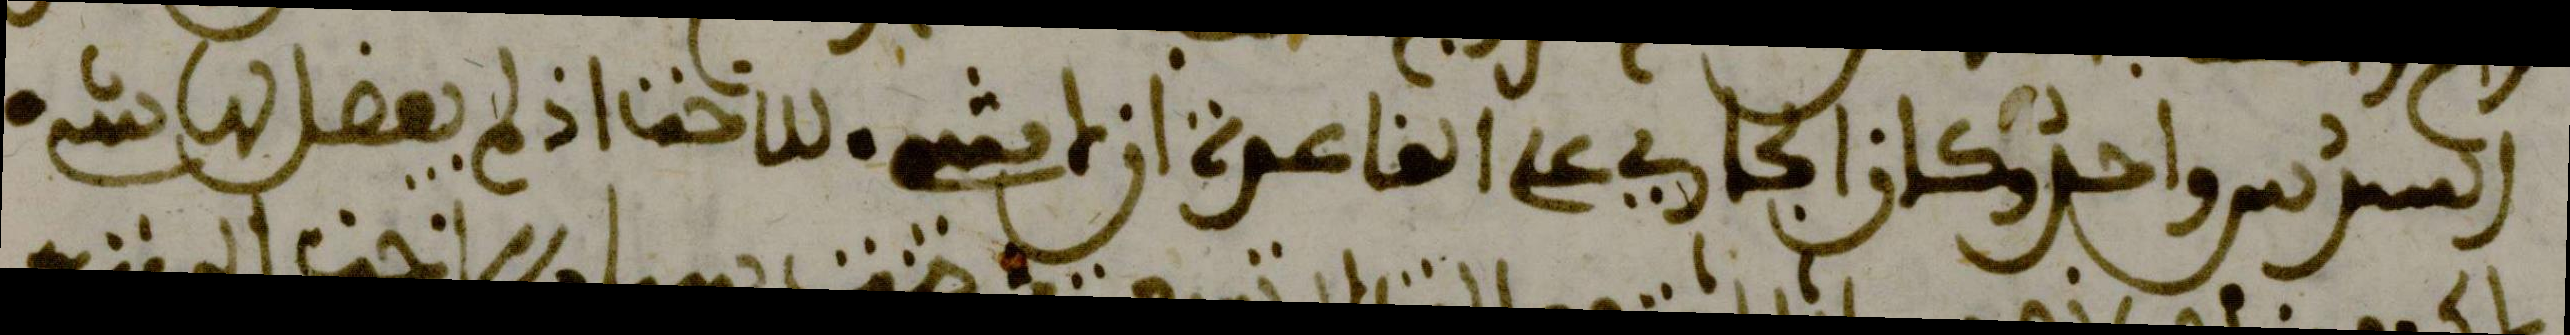السدس واجد وكان الجاري على القاعدة ان لا شيء للاخت اذ لم يفضل لها شيء
